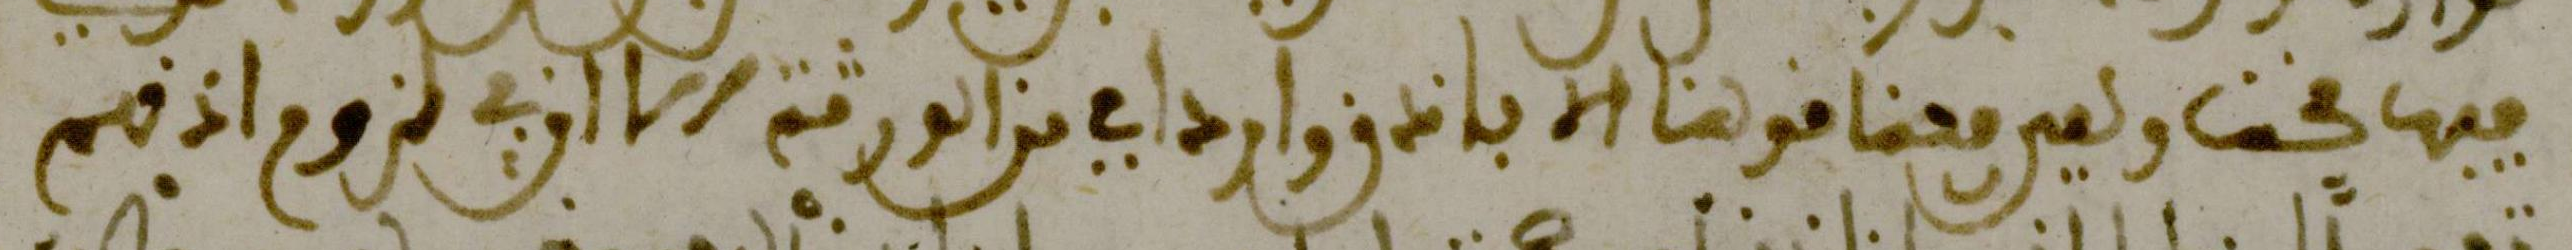فيها صحت وهي معنا قولنا الا باذن وارد اي من لورثة الا ان في لزوم اذ نهم
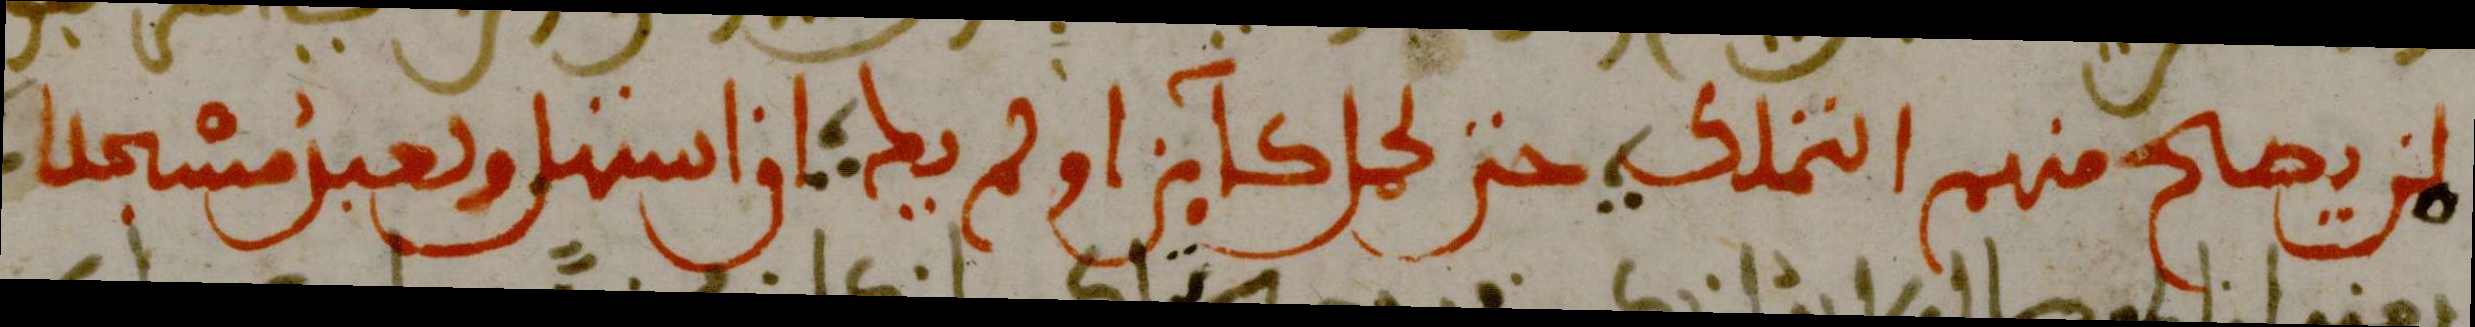لن يصح منهم التملك حتى لحمل كائن او لم يد ان استهل ولعبد مسْحجلا
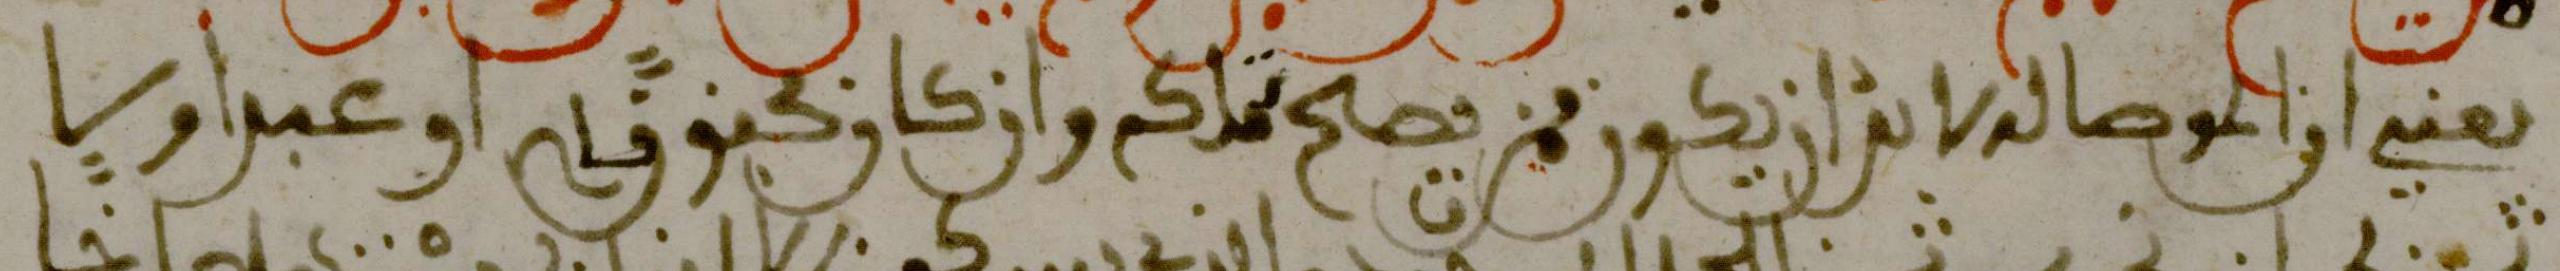يعني ان الموصا له لا بد ان يكون فمن يصح تملكه وان كان مجنون او عبدا ولا
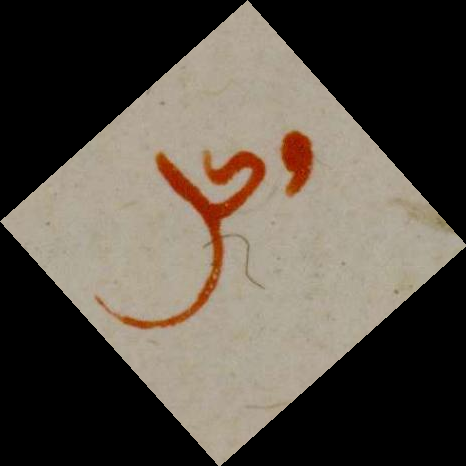وكل
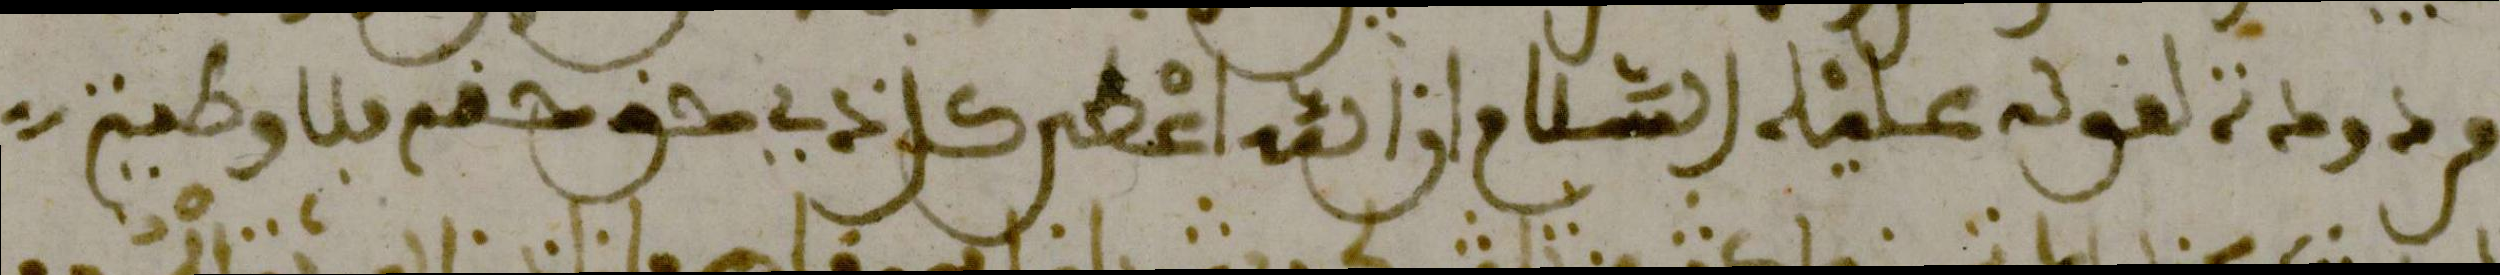مردودة لقوله عليه السّلام ان الله اعطى كل ذي حق حقه فلا وطية
